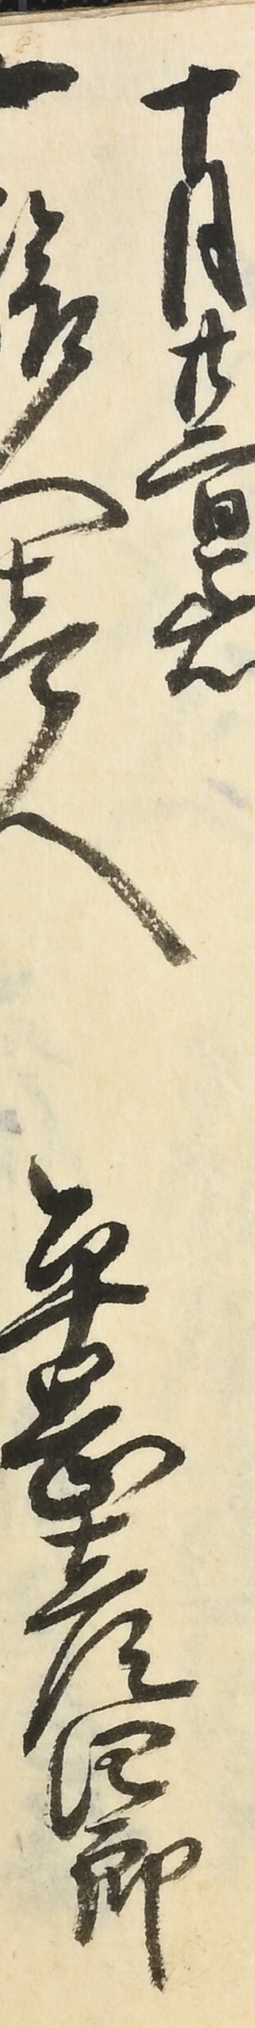一旅人壱人三井八五郎

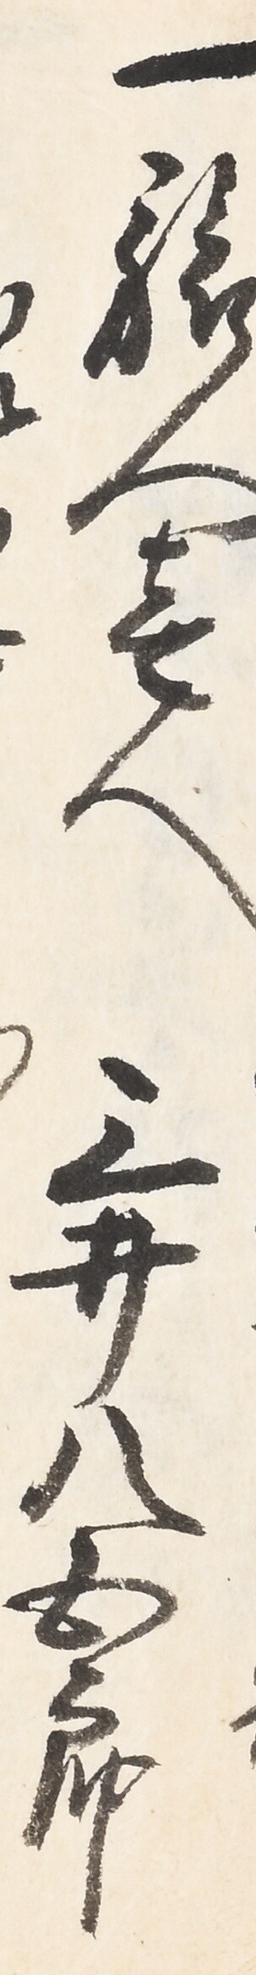一旅人壱人平岡彦四郎
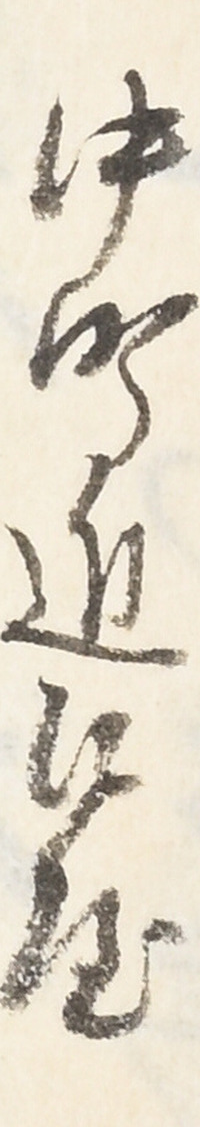中町近江屋
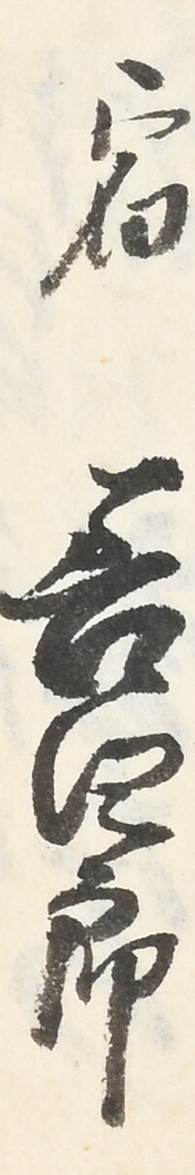宿善四郎
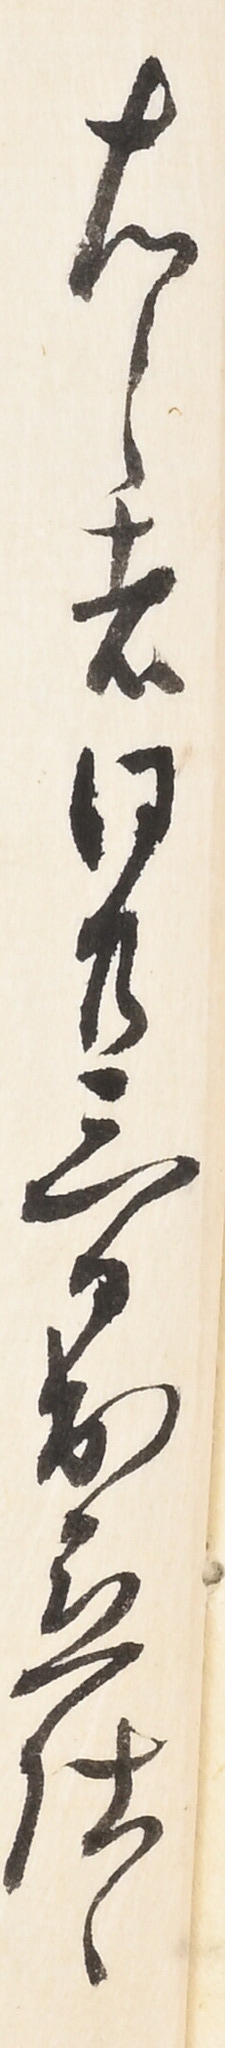右之者同廿三日出立仕候
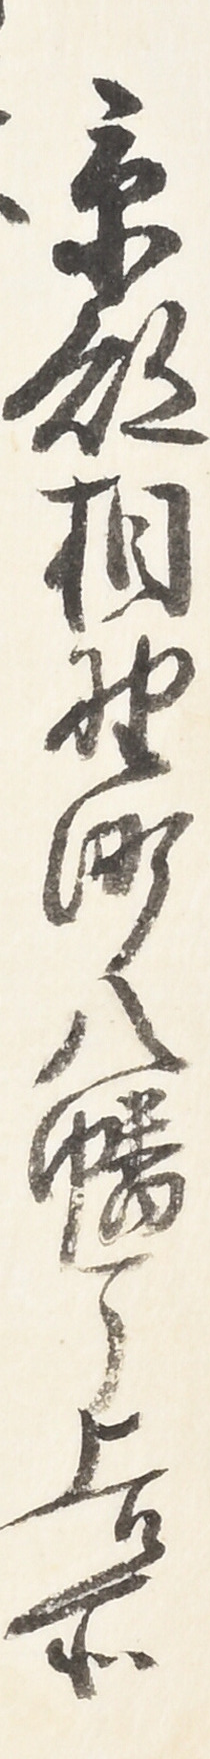京都相野町八幡丁上ル所
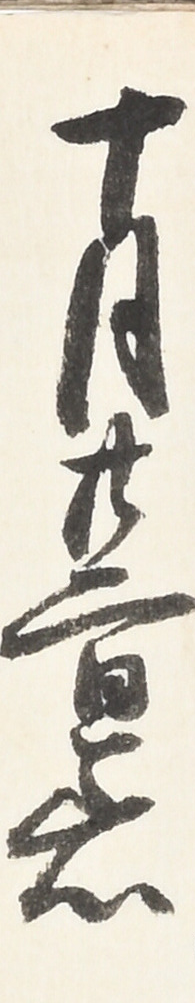十月廿二日着
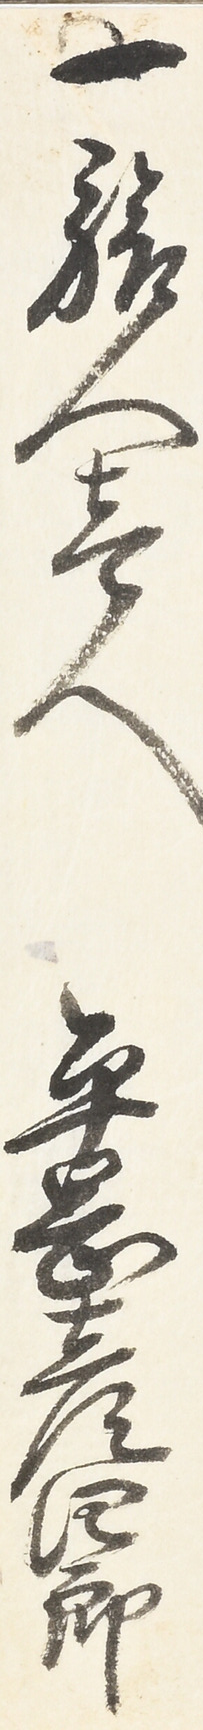一旅人壱人平岡彦四郎
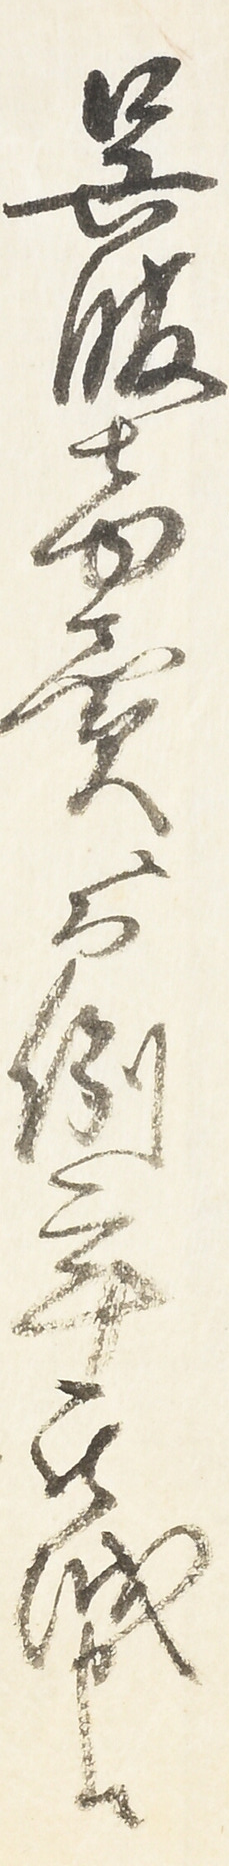呉服商売ニ而例年罷越申候
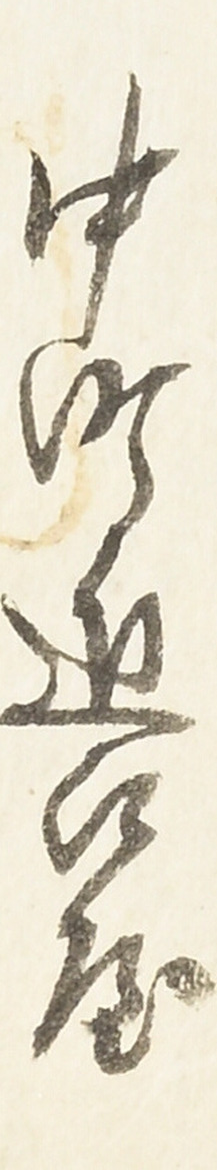中町近江屋
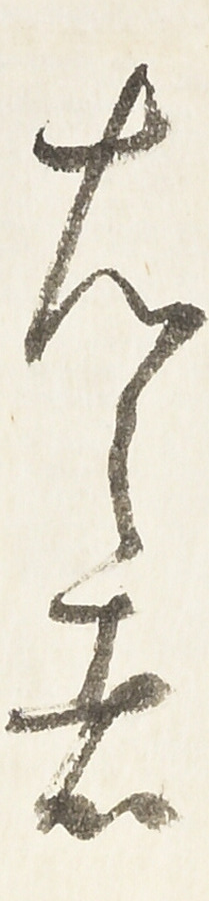右之者
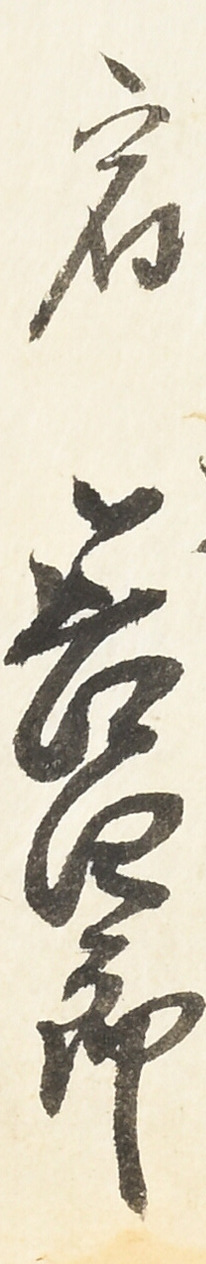宿善四郎
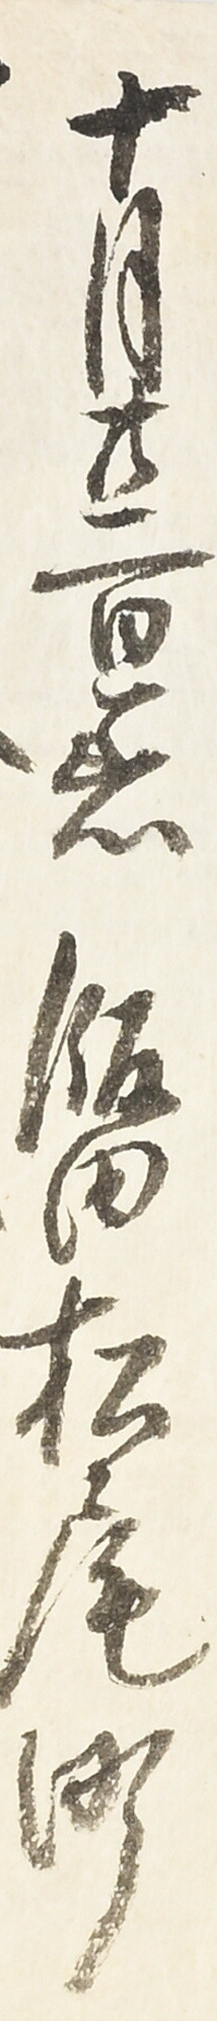十月廿二日着飯田松尾町
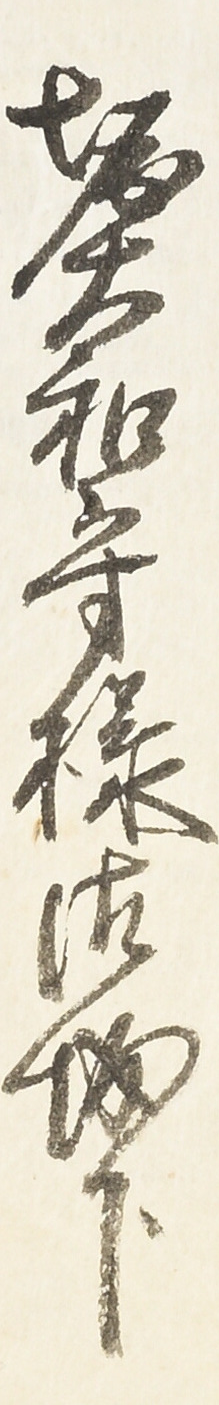堀大和守様御城下
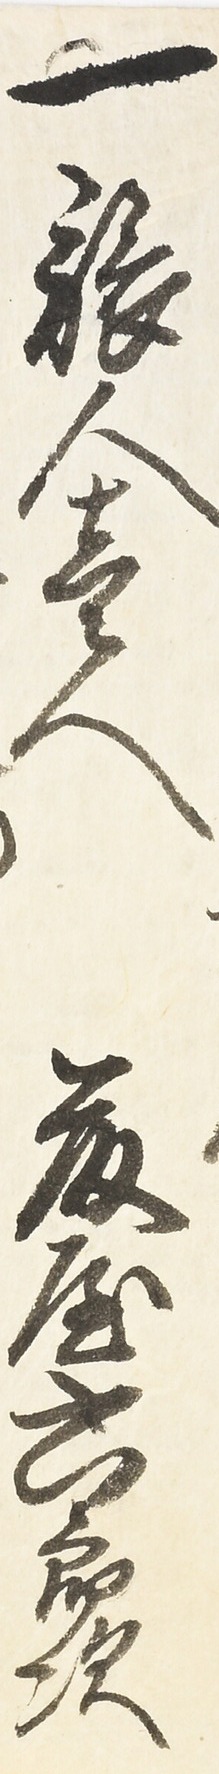一旅人壱人藤屋六郎次
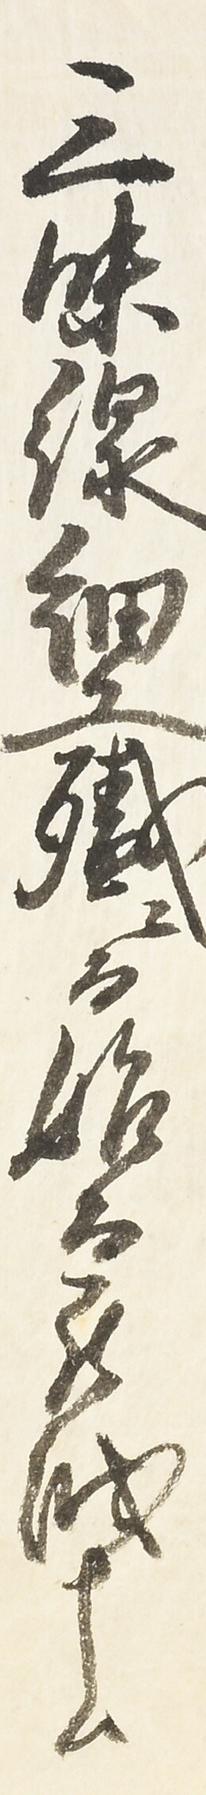三味線細工職ニ而始而罷越申候
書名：町中旅人泊控帳
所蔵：伊那市立高遠町図書館・合同会社AMANE
